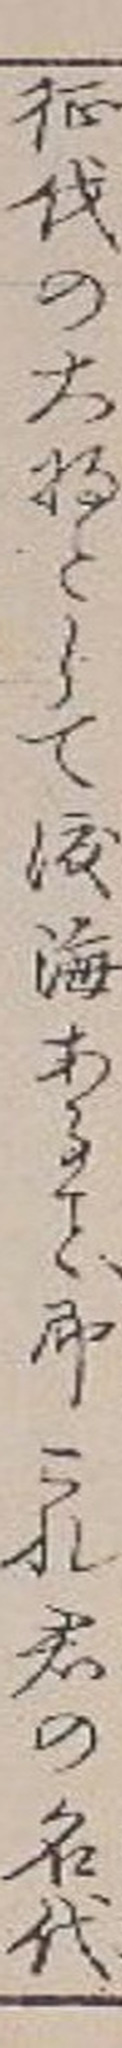征伐の大将として渡海あること、即これ君の名代
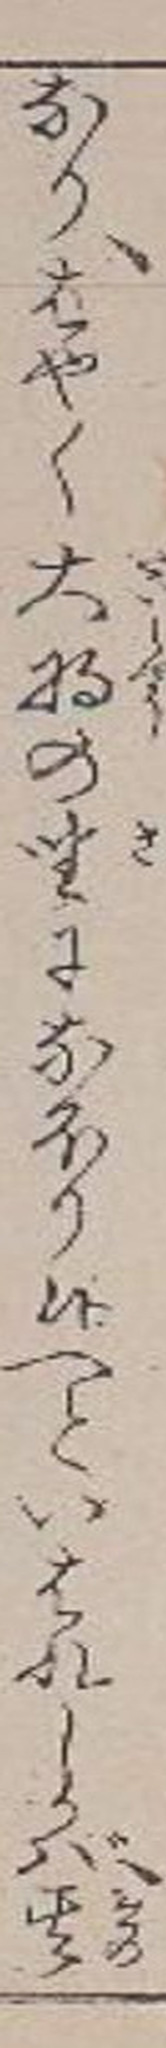なり、はやく大将の坐になほり候へといはれしかば、其
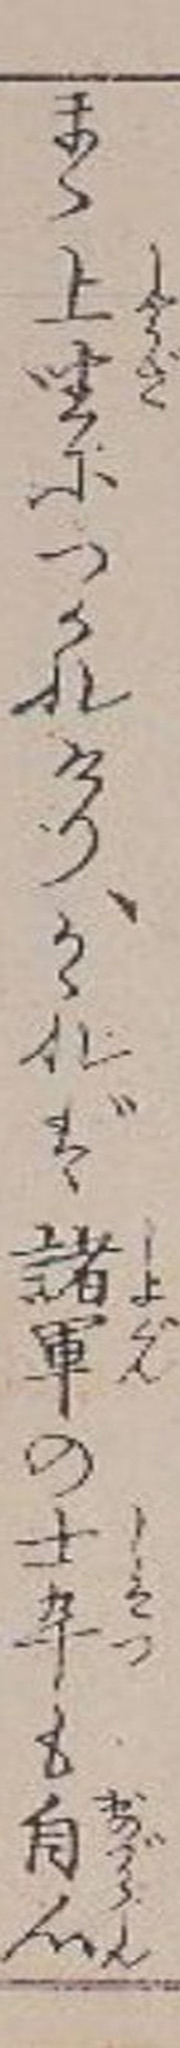まゝ上坐につかれけり、かゝれば諸軍の士卒も自心
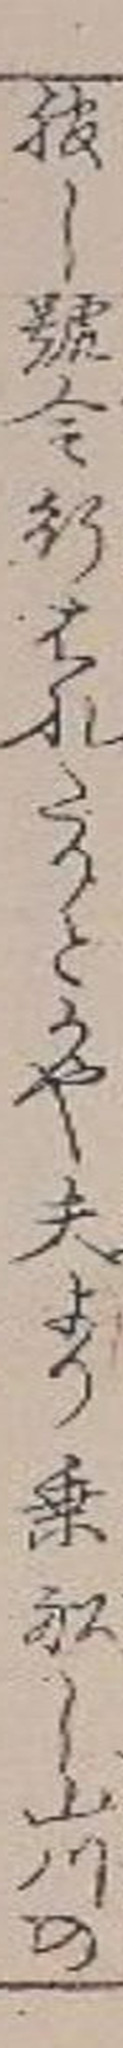服し、号令行はれたりとかや、夫より乗船し、山川の

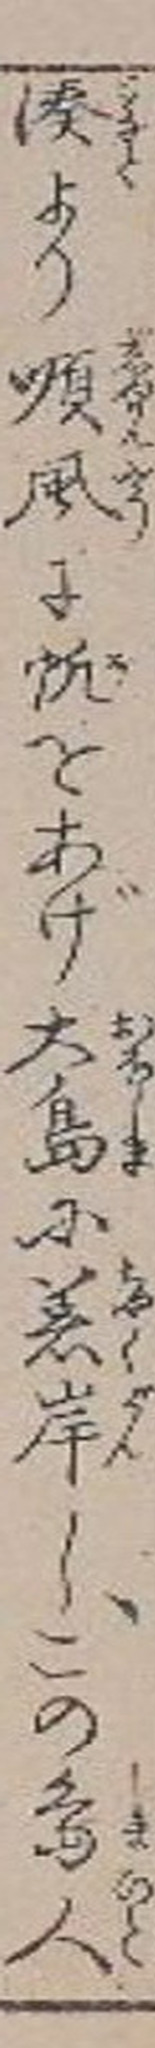湊より順風に帆をあげ大島に着岸し、この島人
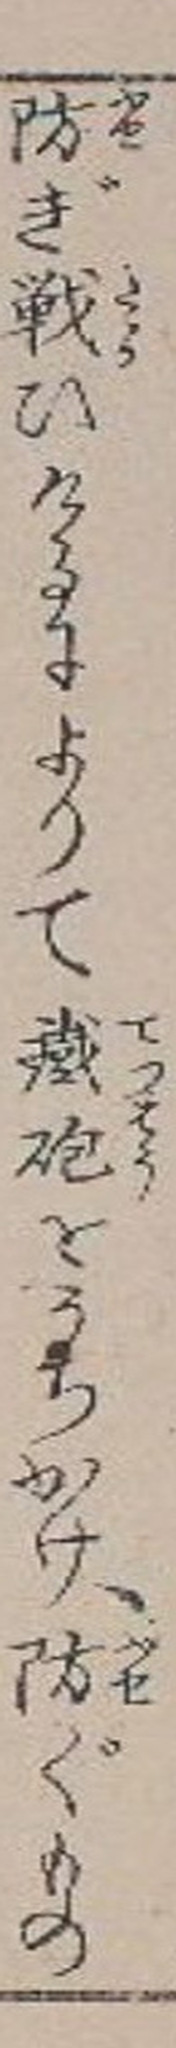防ぎ戦ひけるによりて鉄砲をうちかけ、防ぐもの
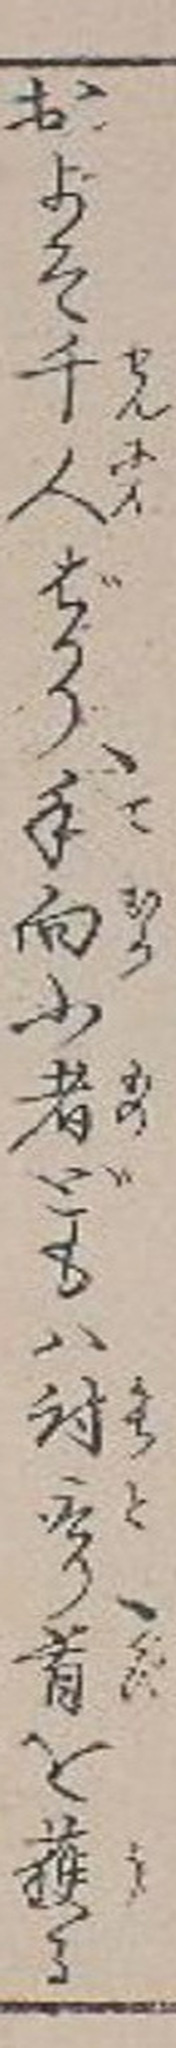およそ千人ばかり、手向ふ者どもは討取り、首を獲る
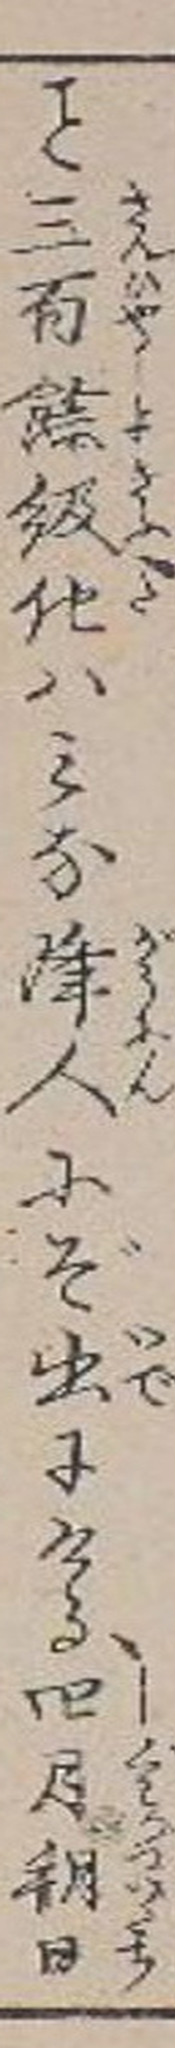こと三百余級、他はみな降人にぞ出にける、四月朔日
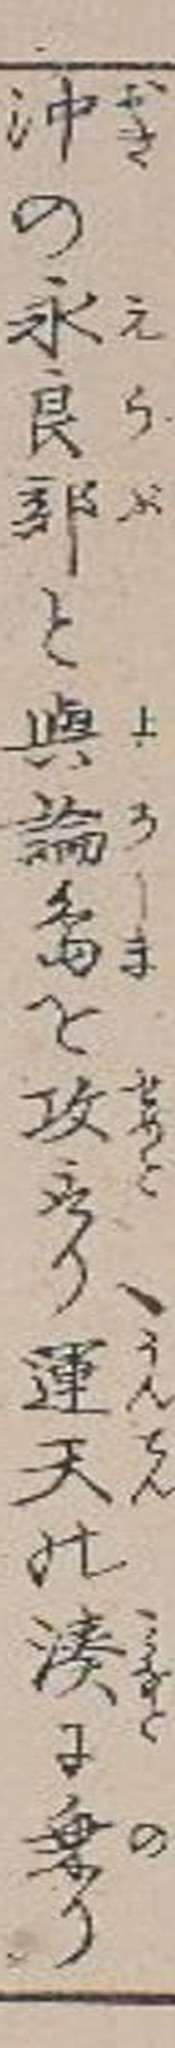沖の永良部と与論島を攻取り、運天の湊に乗り
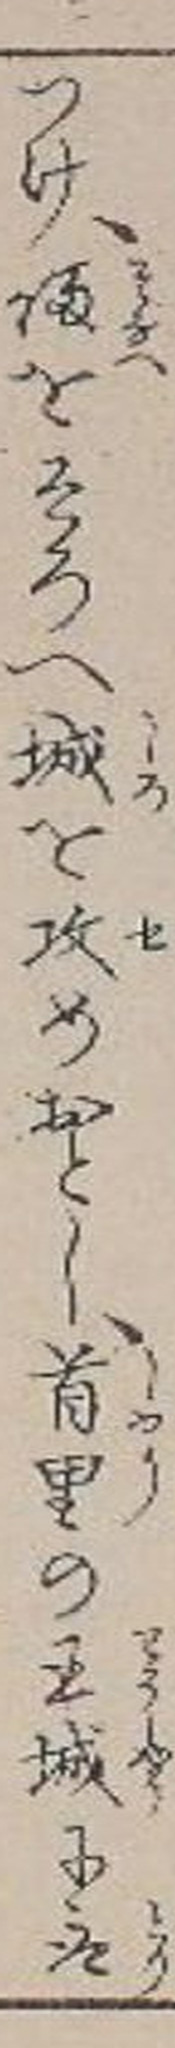つけ、備をそろへ城を攻めおとし、首里の王城に取
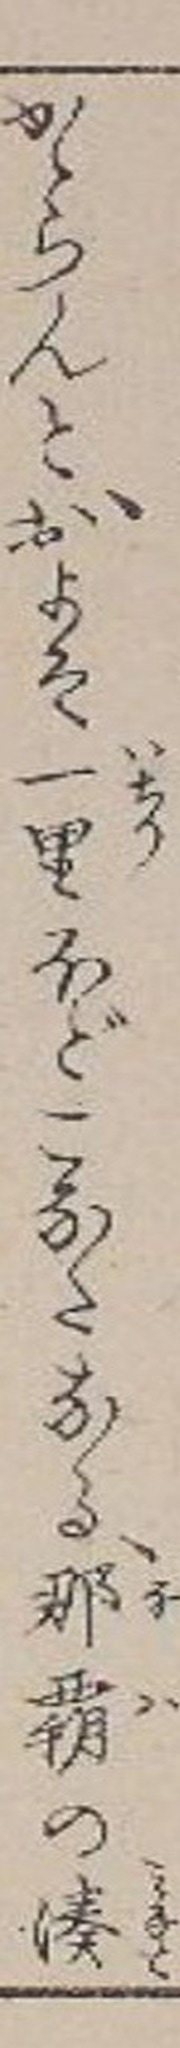かゝらんと、およそい一里ほどこなたなる、那覇の湊
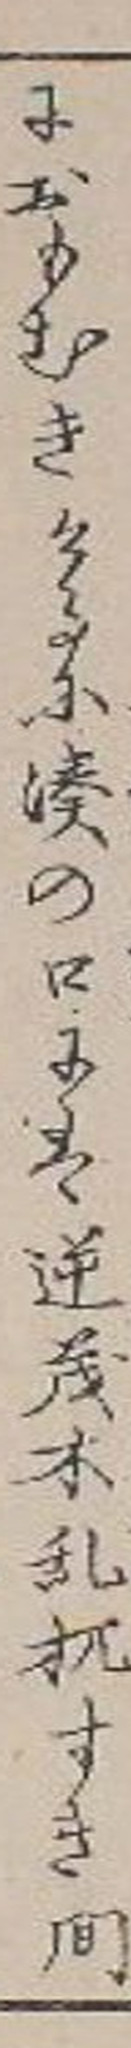におもむきけるに、湊の口には逆茂木乱杭すき間
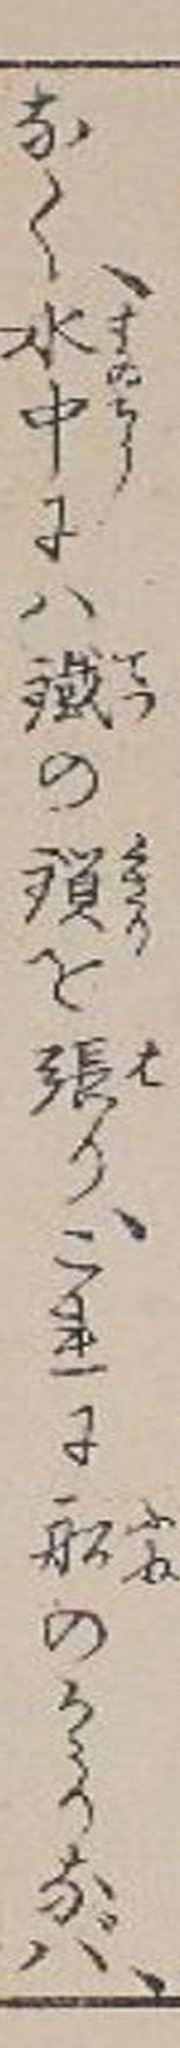なく、水中には鉄の鎖を張り、これに船のかゝりなば、
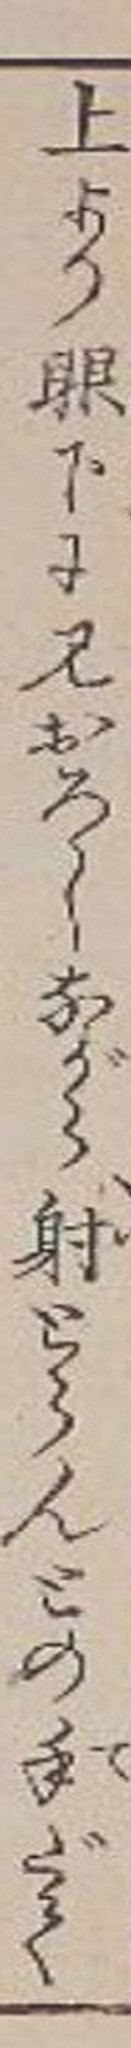上より眼下に見おろしながら、射とらんとの手だて
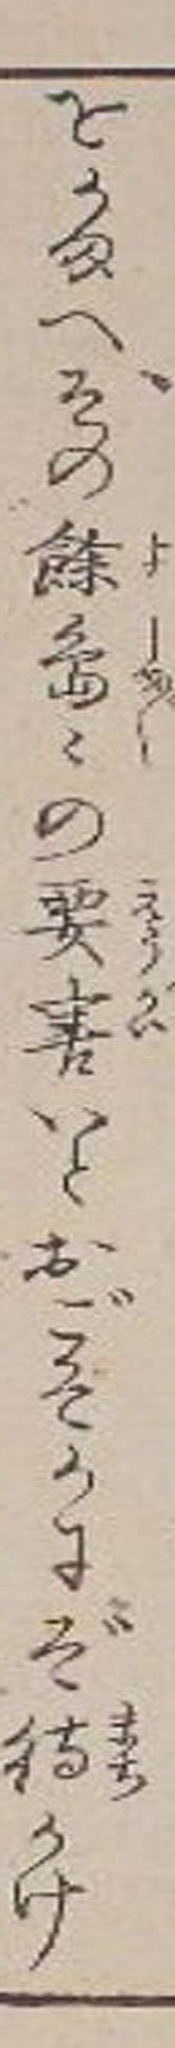をかまへ、その余島々の要害いとおごそかにぞ待かけ
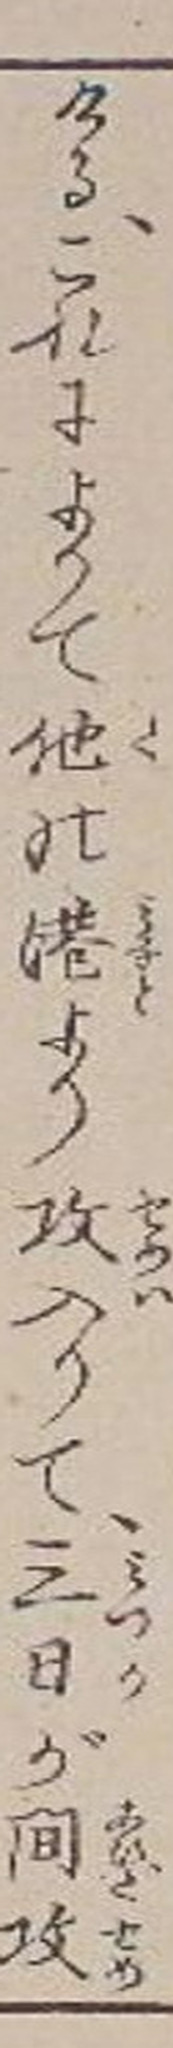ける、これによりて他の港より攻入りて、三日が間攻
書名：琉球入貢紀略
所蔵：University of the Ryukyus Library
